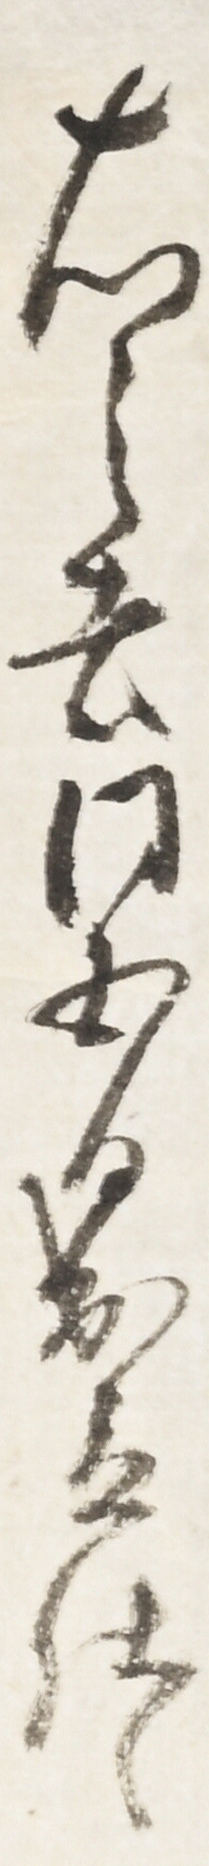右之者同五日出立仕候
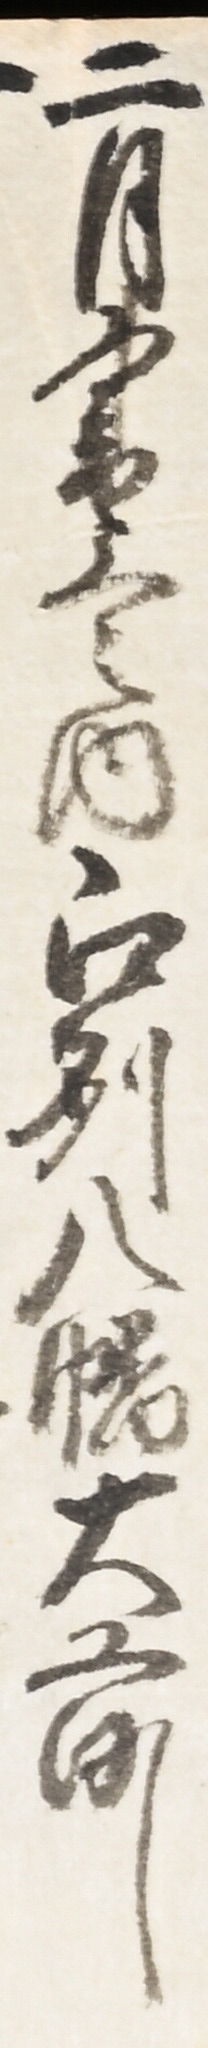二月書上之内江州八幡大工町
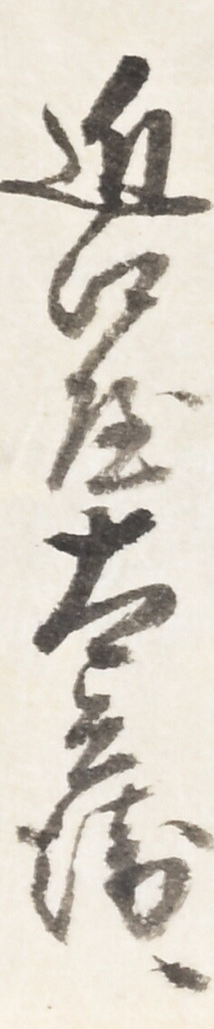一近江屋太兵衛・
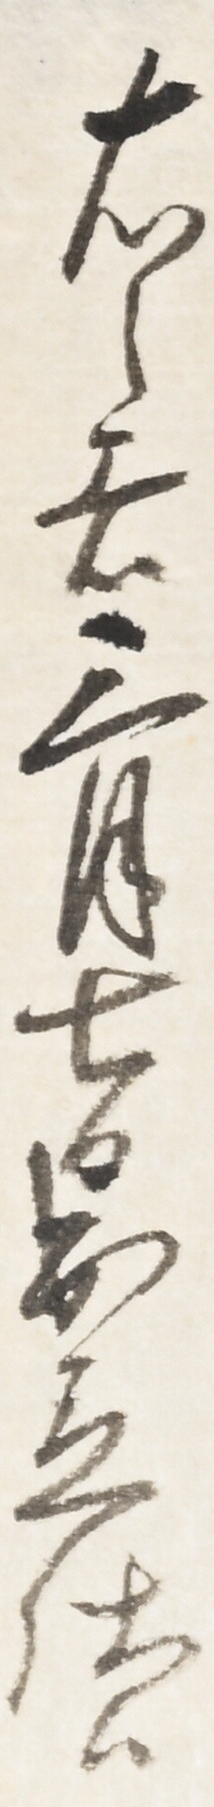右之者三月七日出立仕候
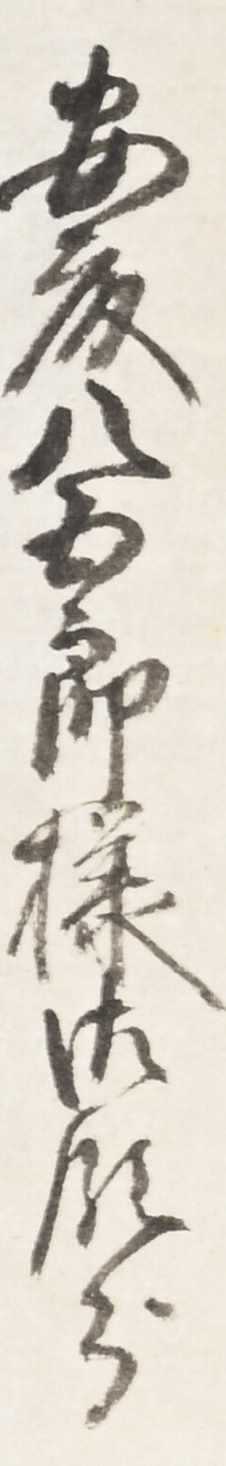安藤八五郎様御領分
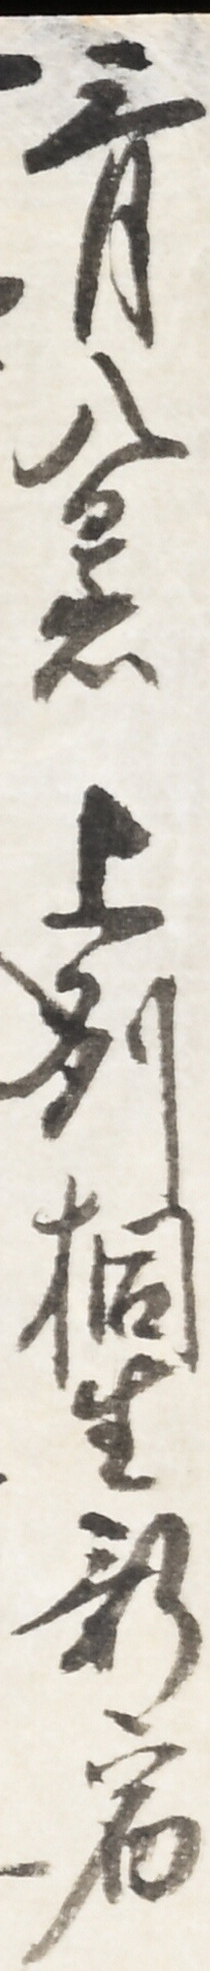三月八日着上州桐生新宿
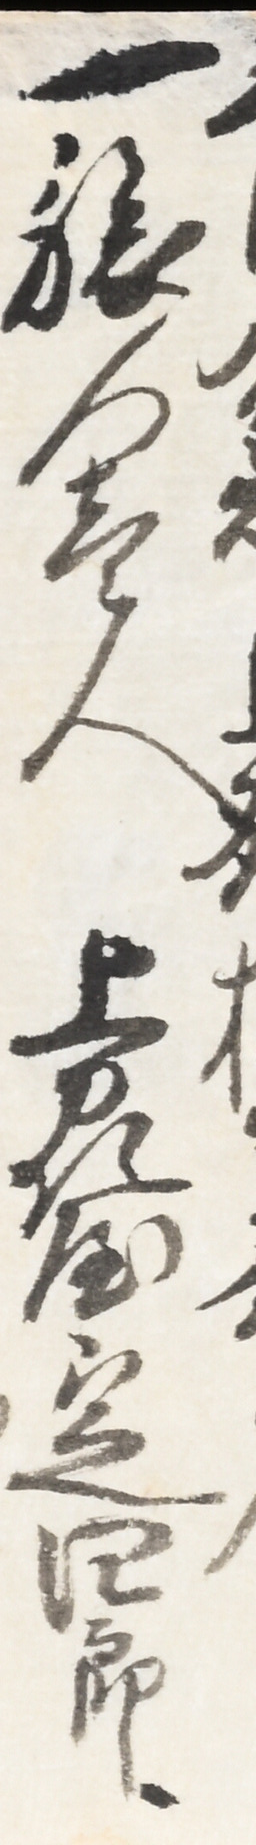一旅人壱人上州屋定四郎・
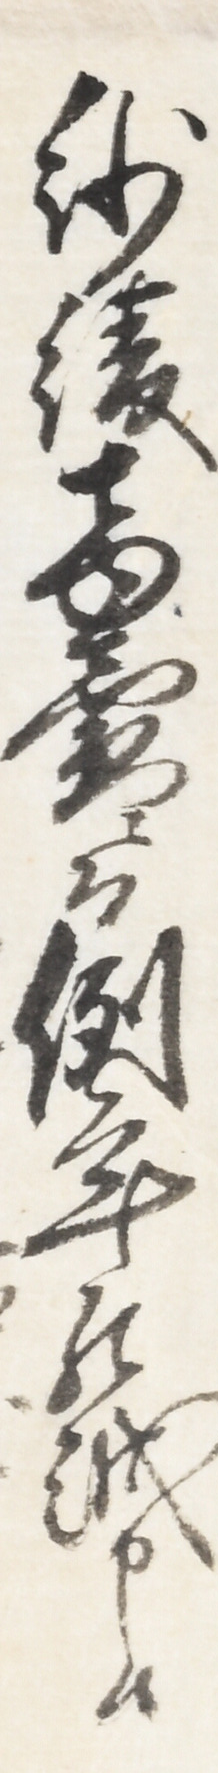硯商売ニ而例年罷越申候
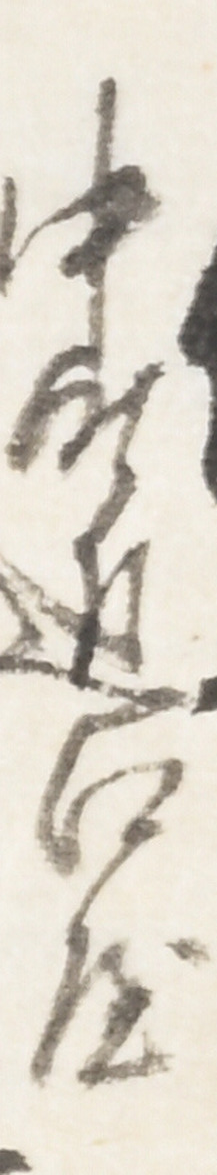中町近江屋
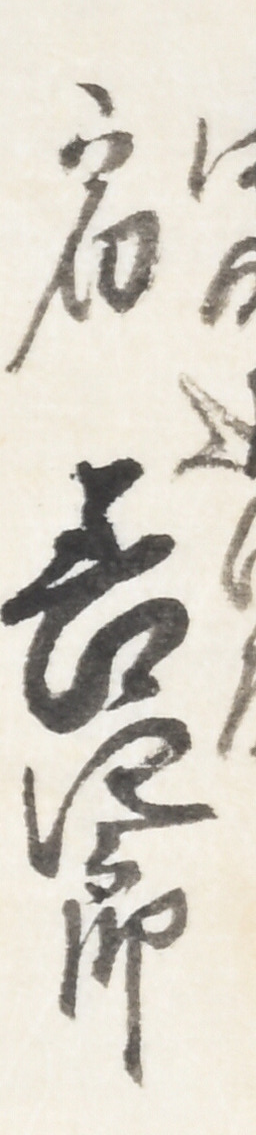宿善四郎
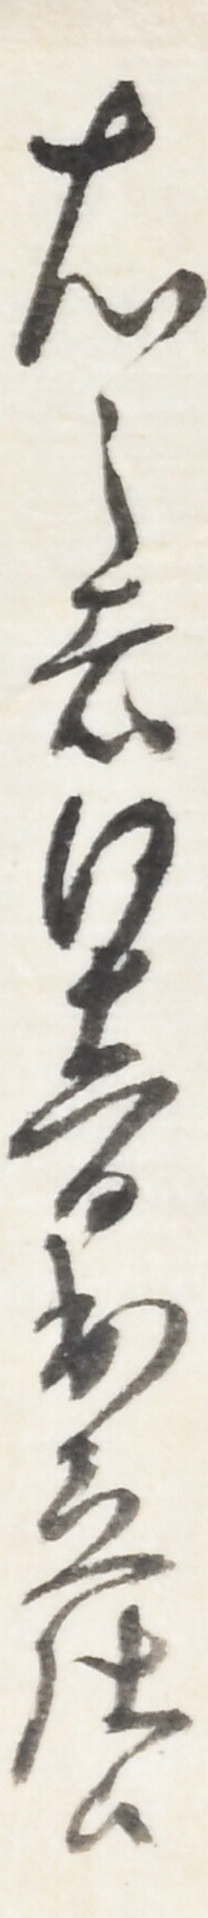右之者同十二日出立仕候
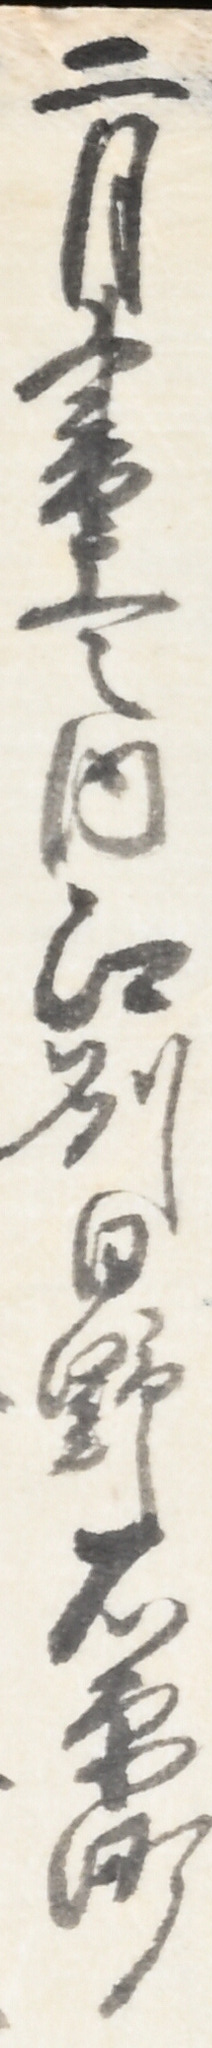二月書上之内江州日野石原町
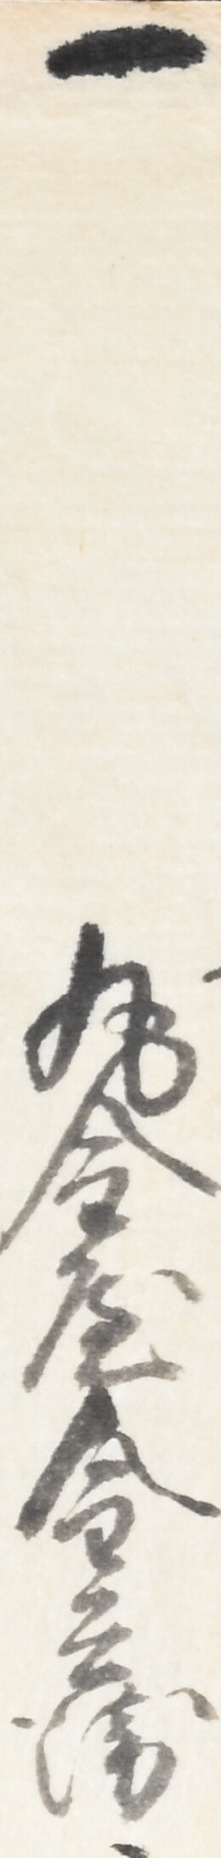一丸金屋金兵衛・
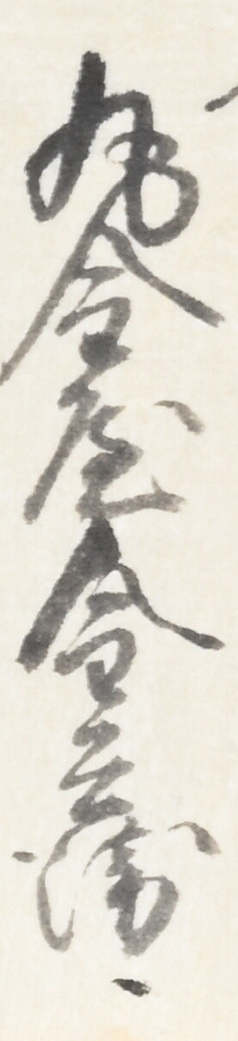一丸金屋金兵衛・
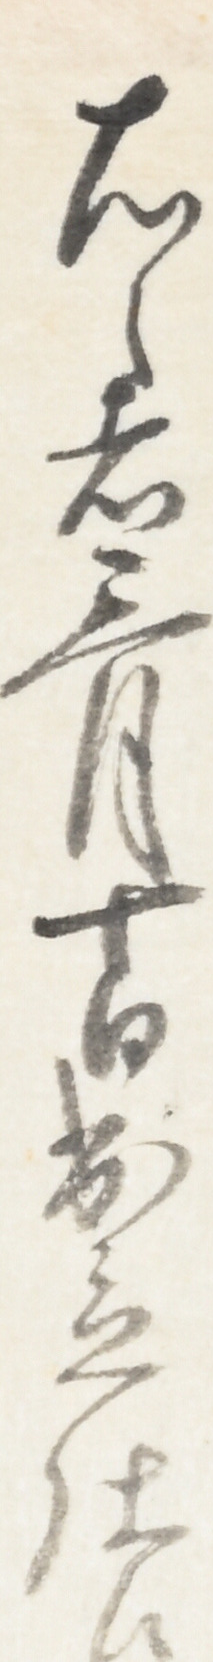右之者三月十日出立仕候
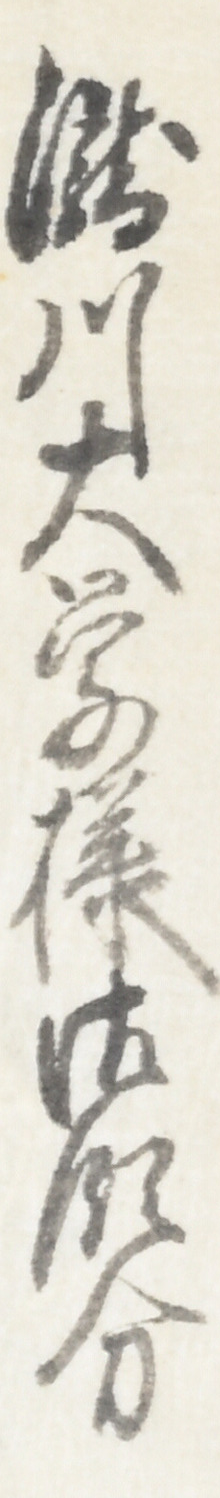瀧川大学様御領分
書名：旅人泊控帳
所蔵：伊那市立高遠町図書館・合同会社AMANE
